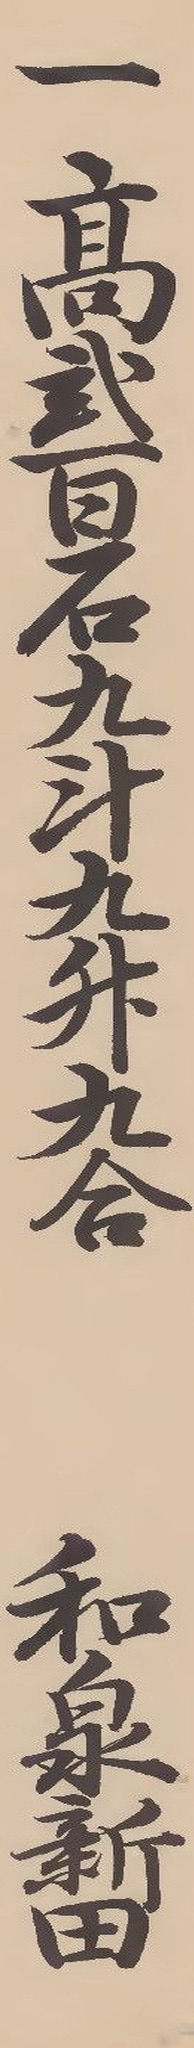一高弐百石九斗九升九合和泉新田
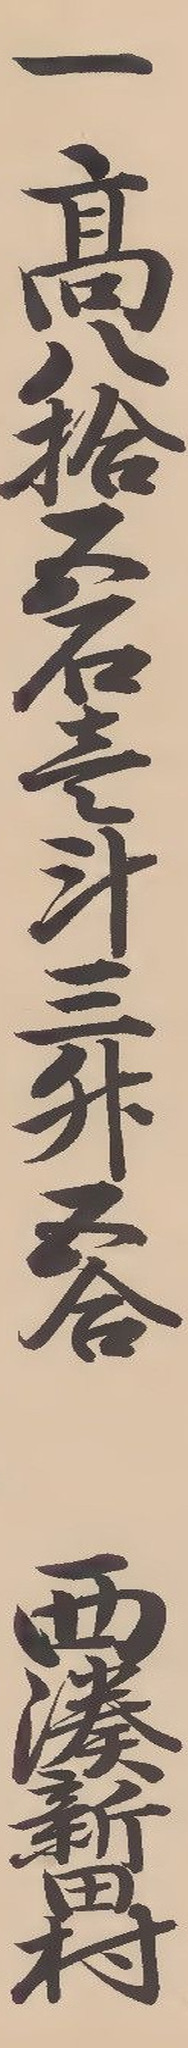一高八拾五石壱斗三升五合西湊新田村
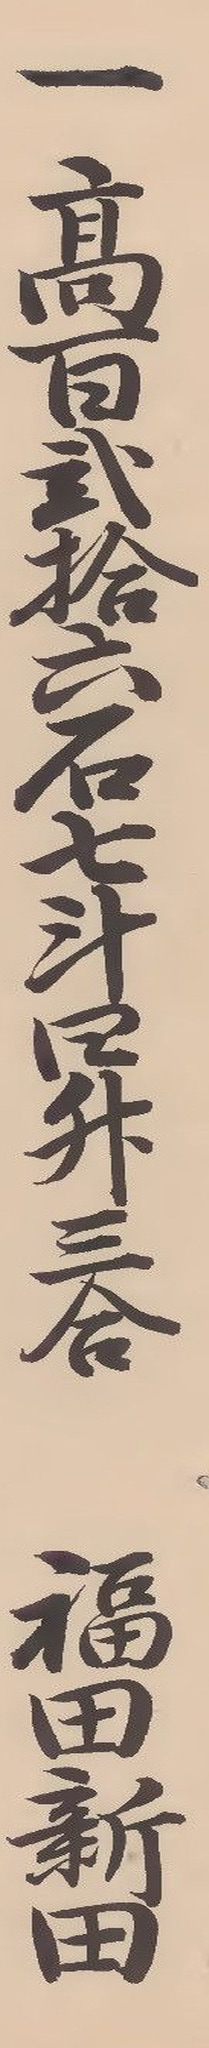一高百弐拾六石七斗四升三合福田新田
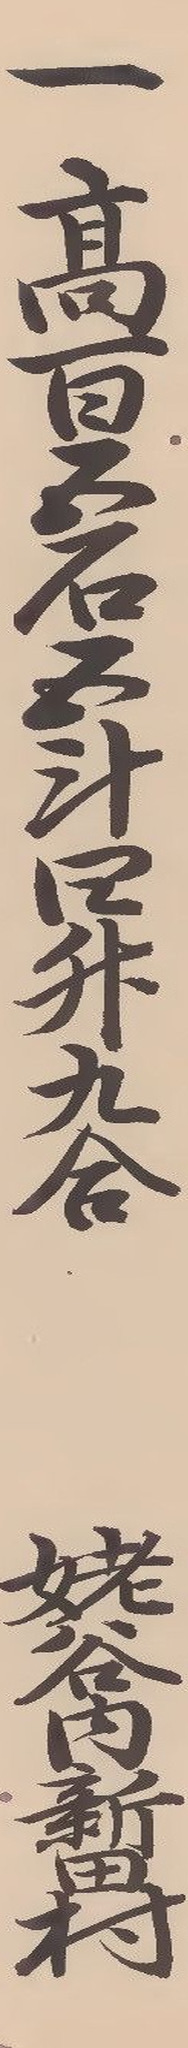一高百五石五斗四升九合姥谷内新田村
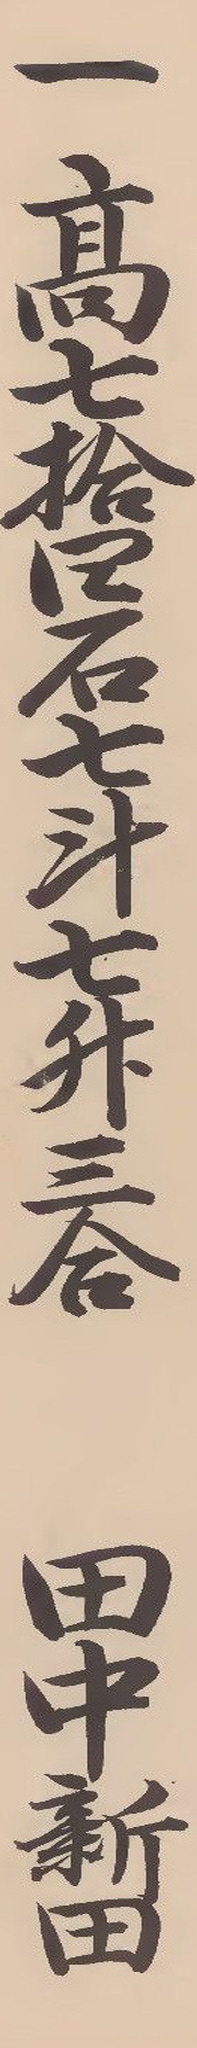一高七拾四石七斗七升三合田中新田
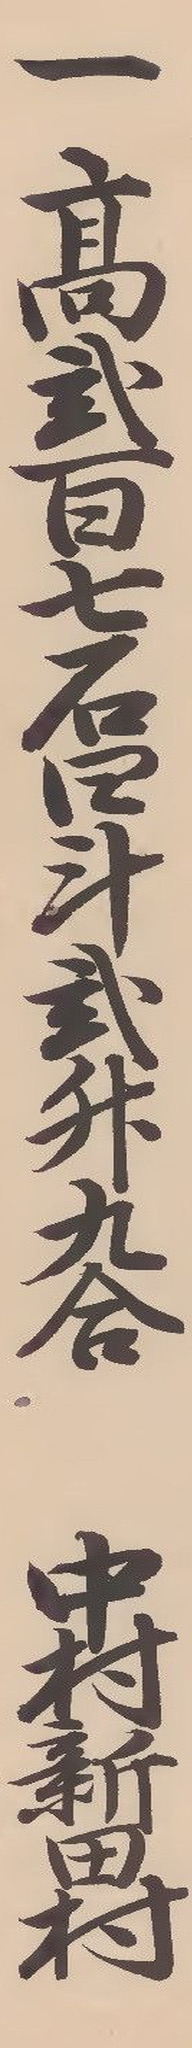一高弐百七石四斗弐升九合中村新田村

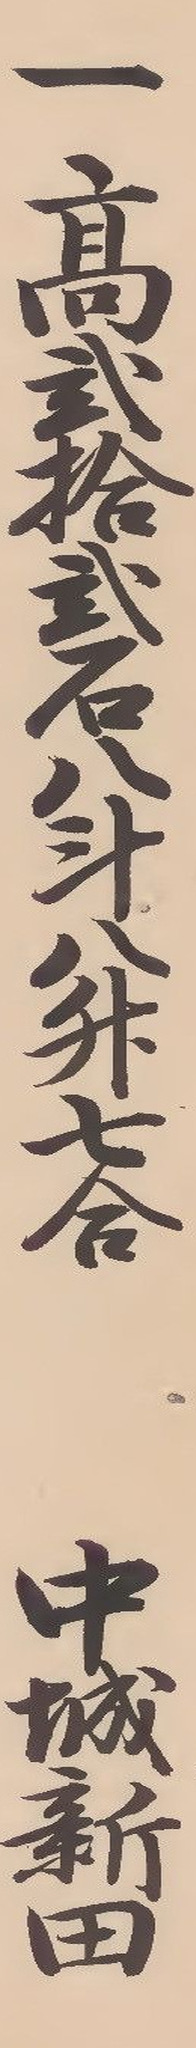一高弐拾弐石八斗八升七合中城新田
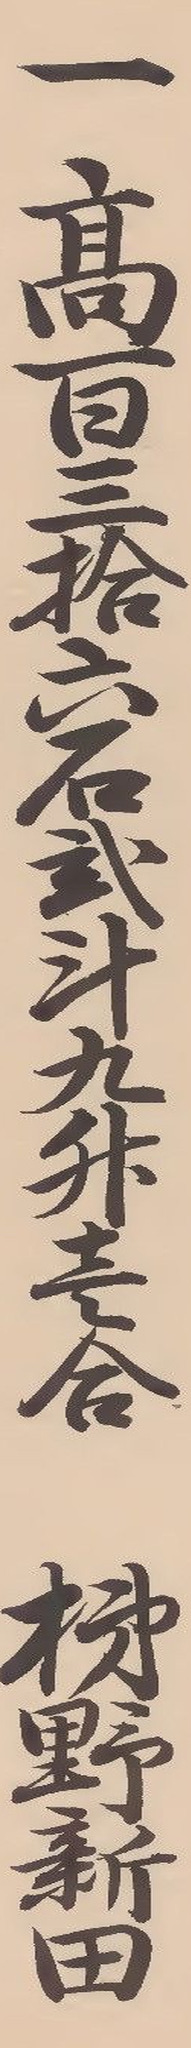一高百三拾六石弐斗九升壱合柿野新田
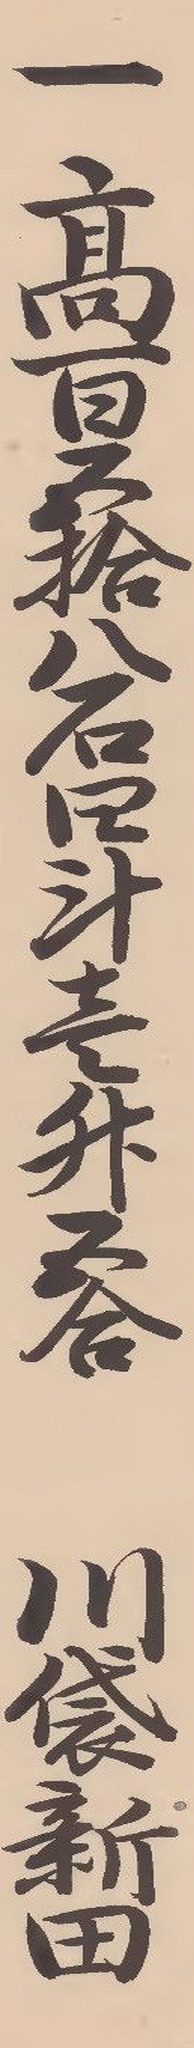一高百五拾八石四斗壱升五合川袋新田
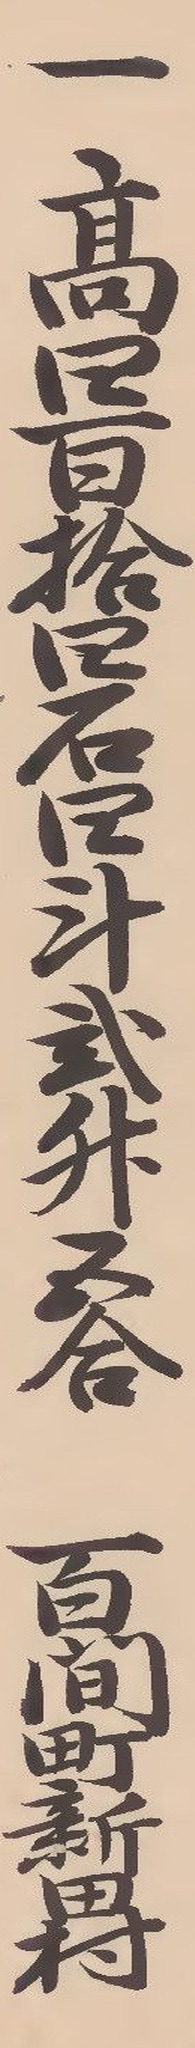一高四百拾四石四斗弐升五合百間町新田村
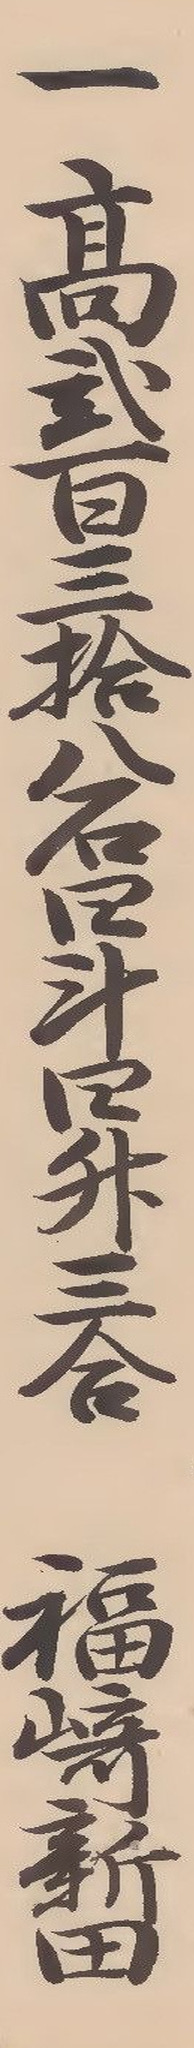一高弐百三拾八石四斗四升三合福崎新田
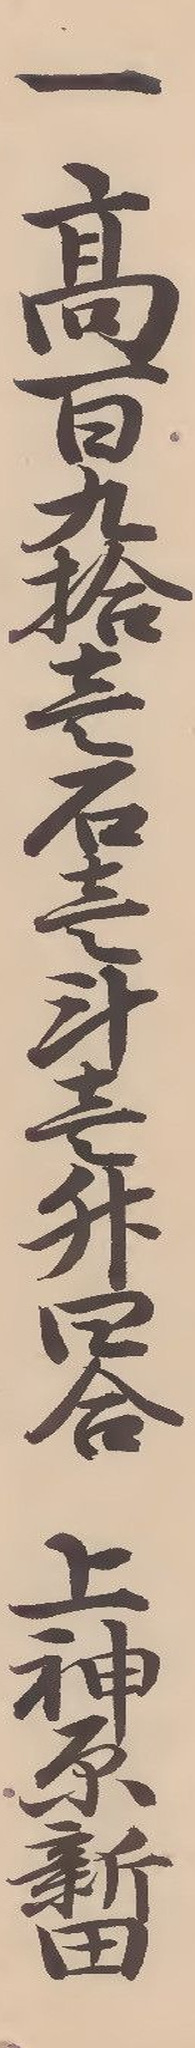一高百九拾壱石壱斗壱升四合上神原新田
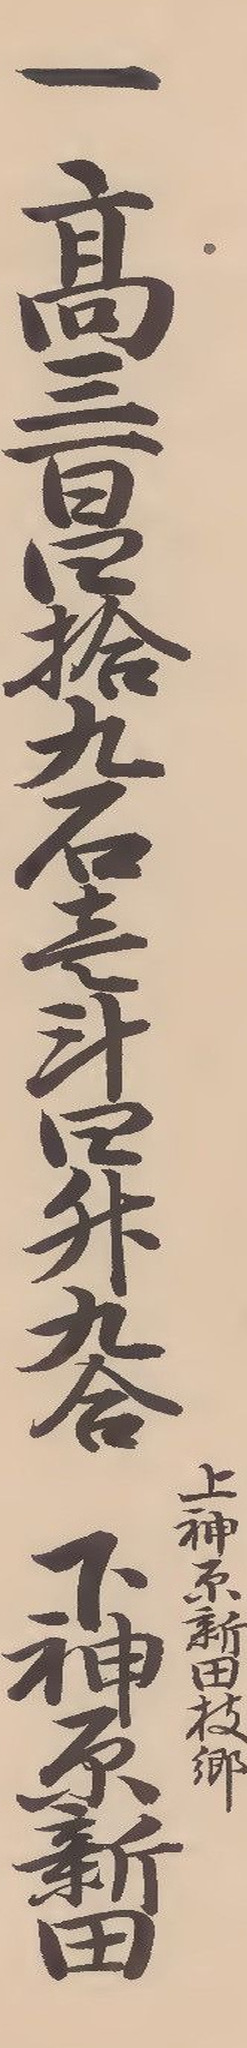一高三百四拾九石壱斗四升九合下神原新田
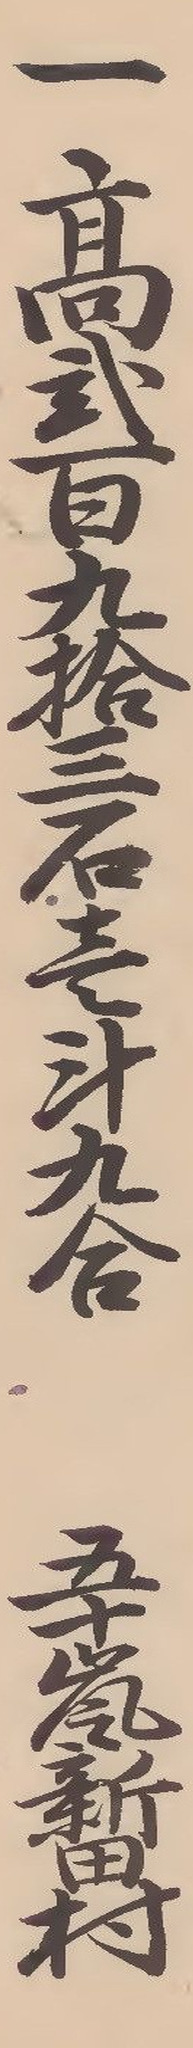一高弐百九拾三石壱斗九合五十嵐新田村

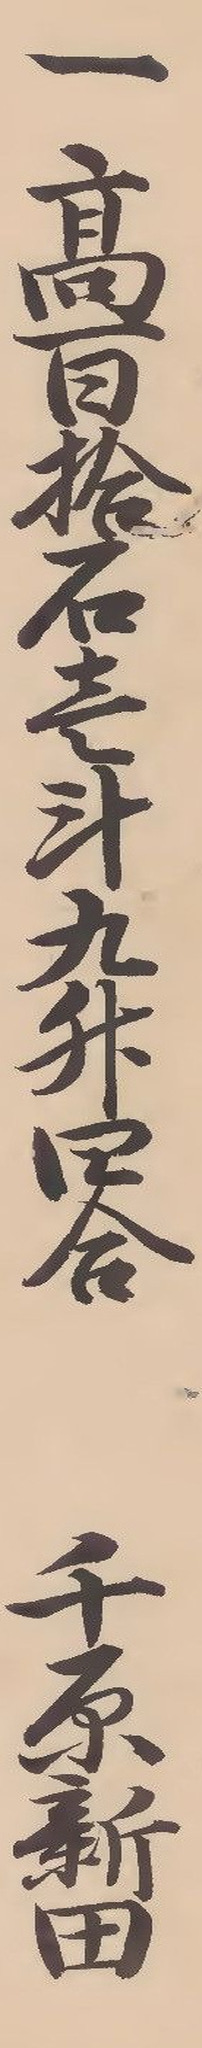一高百拾石壱斗九升四合千原新田
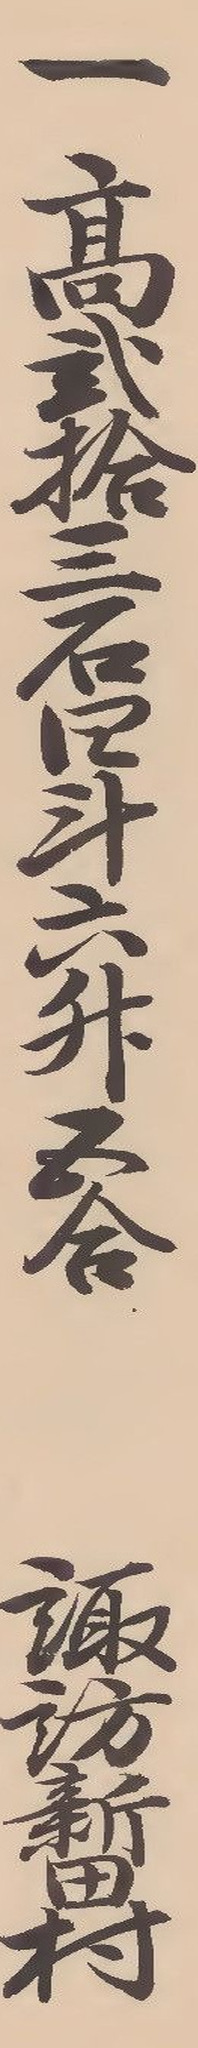一高弐拾三石四斗六升五合諏訪新田村
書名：越後国郷帳　上
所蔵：国立公文書館 National Archives of Japan
